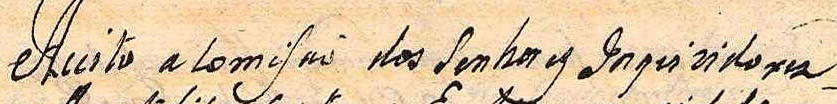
Aceito a comisao dos senhorez Inquizidorez
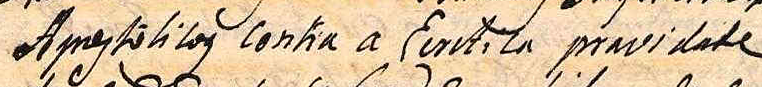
Apostolicos contra a heretica pravidade
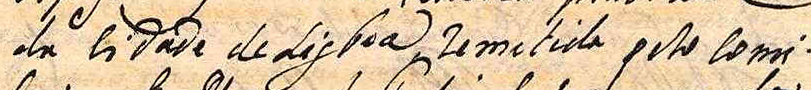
da cidade de Lisboa, Remetida pelo comi
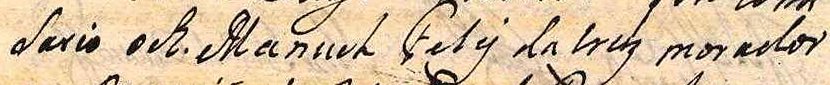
sario o R. ManueL Felis da Cruz morador
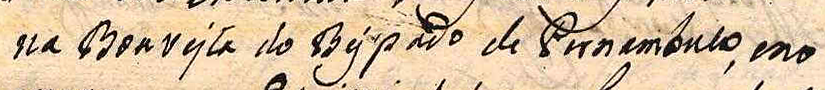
na Boavista do Bispado de Pernambuco, e no
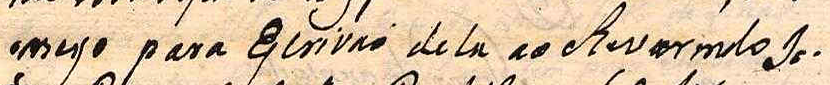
meyo para Escrivaõ dela ao Reverendo Jo
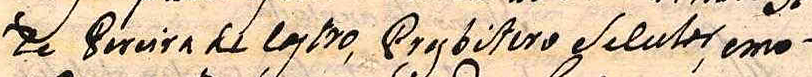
ze Pereira de castro, Presbitero seCular, e mo
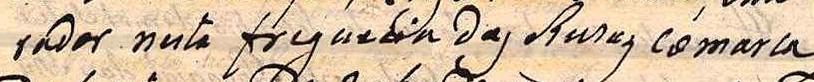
rador nesta freguezia das Rusaz comarca
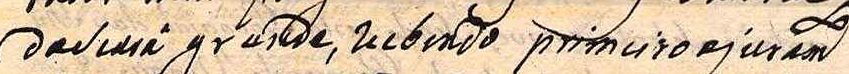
do seará grande, Recebendo primeiro o juram.to
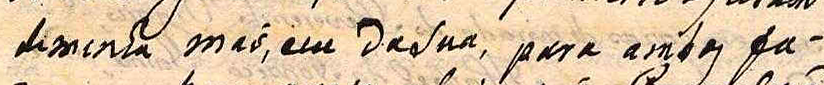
de minha maõ, e eu da sua, para ambos fa
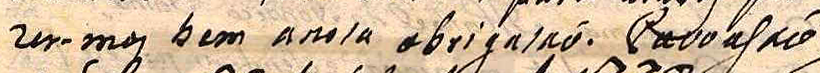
zer-mos bem a nosa obrigasaõ. Povoasaõ
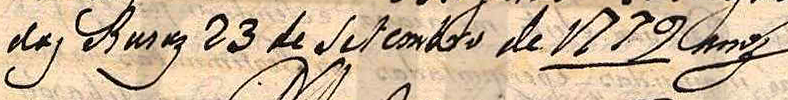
das Rusaz 23 de Setembro de 1779 annoz
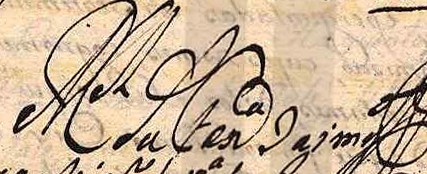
M.el da Fonca Iaime
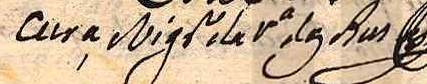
cura, e Vigr.o da V.a dos Rusas
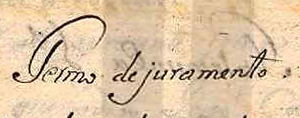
Termo de juramento.
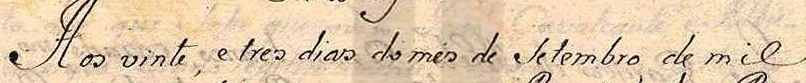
Aos vinte, e tres dias do mes de Setembro de mil
